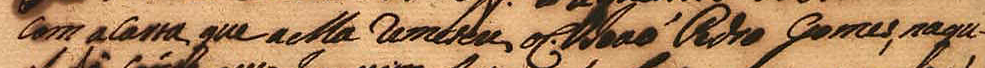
com a carta que a ella Remeteu, o C. Ioaõ Pedro Gomes, na qu
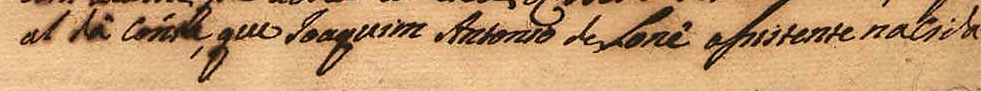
al dá conta, que Ioaquim Antonio de Loné assistente na Cida
